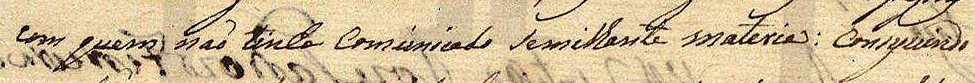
com quem naõ tinha comunicado semilhante materia: conseguindo
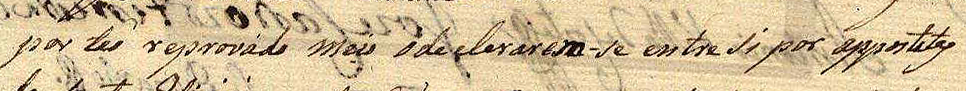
por taõ reprovado meio o declararem-se entre si por appostatas
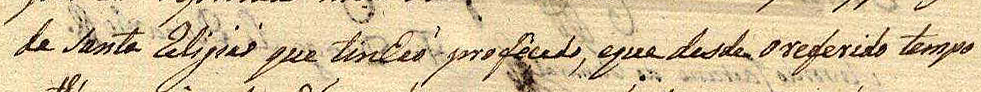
da santa Religiaõ que tinhaõ profeçado, e que desde o referido tempo
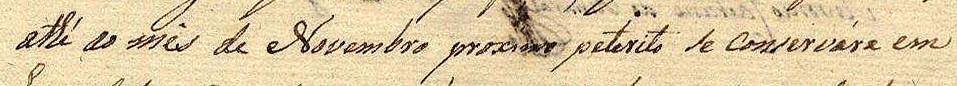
athé ao mês de Novembro proximo peterito se conservara em
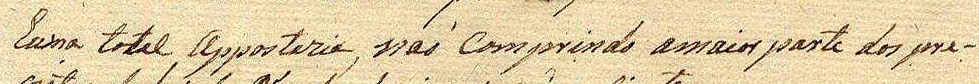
huma total Appostazia, naõ comprindo a maior parte dos pre
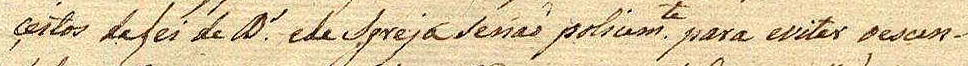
ceitos da Lei de D.s e da Igreja senaõ policem.te para evitar o escan
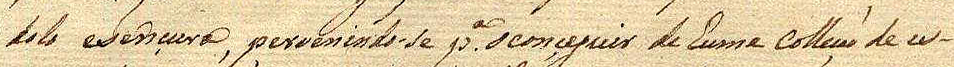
dolo e sençura, pervenindo-se p.a o conceguir de huma colleçaõ de es
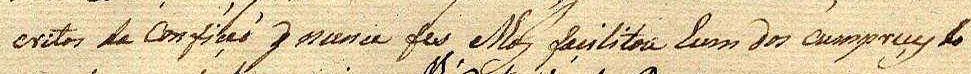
critos da confiçaõ q̄ nunca fes e lhos facilitou hum dos cumprices do
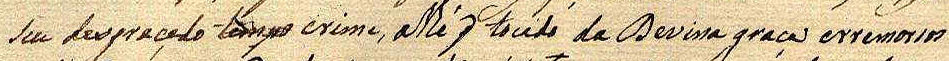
seu despreçado tempo crime, athé q̄ tocado da Devina graça e rremorsos
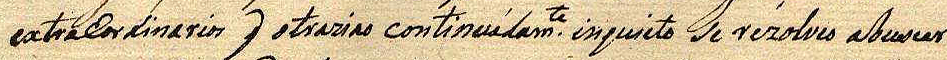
extrahordinarios q̄ o traziaõ continuadam.te inquieto se rezolveo a buscar
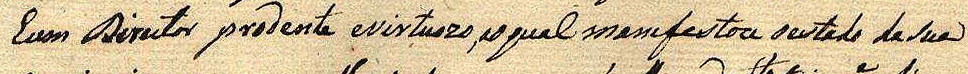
hum Director prodente e virtuozo, ao qual manifestou o estado da sua
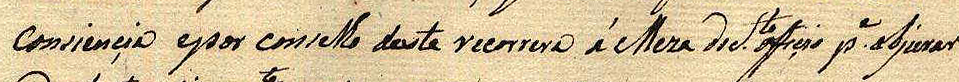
consiencia e por conselho deste recorrera á Meza do S.to officio p.a abjurar
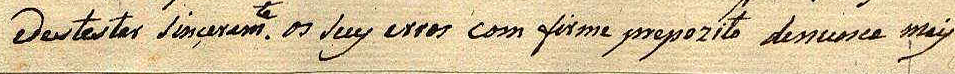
e destestar sinceram.te os seus erros com firme prepozito de nunca mais
